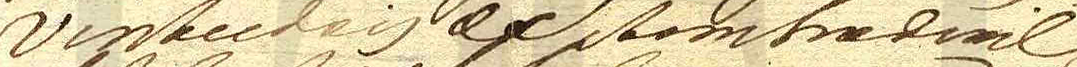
vinte e dois de Setembro de mil
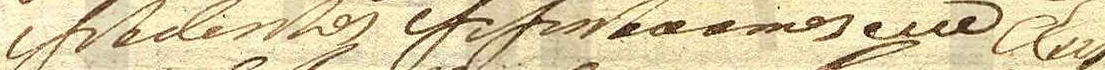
e seteCentos e sesenta annos e eu Chris
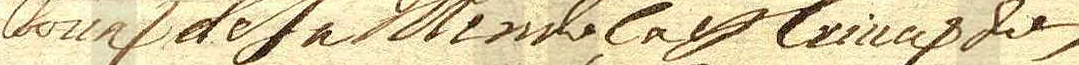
touão de Sa MendoÇa esCriuaõ dos
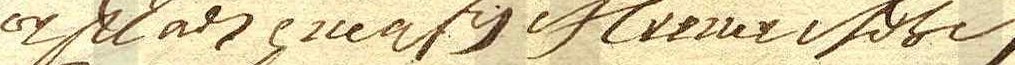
orphaos que a fis esCreuer e sobes
